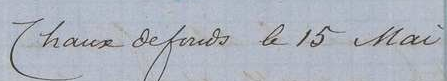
Chaux de fonds le 15 Mai
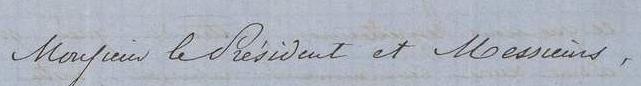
Monsieur le Président et Messieurs,
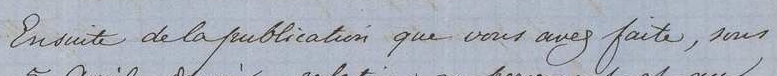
Ensuite de la publication que vous avez faite, sous
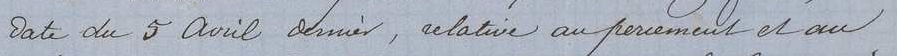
date du 5 Avril dernier, relative au percement et au
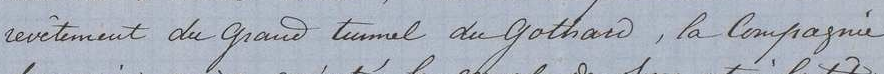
revêtement du Grand Tunnel du Gothard, la Compagnie
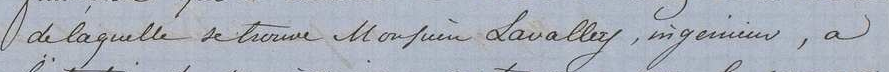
de laquelle se trouve Monsieur Lavalley, ingénieur, a
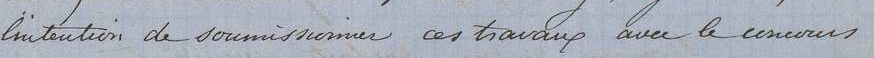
l'intention de soumissionner ces travaux avec le concours
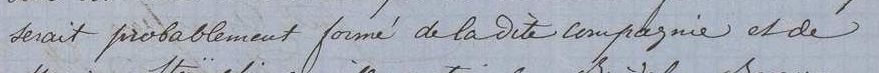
serait probablement formé de la dite compagnie et de
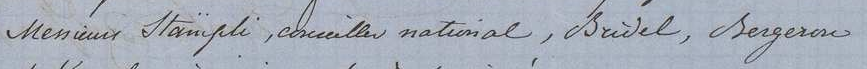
Messieur Stämpli, conseiller national, Bridel, Bergeron
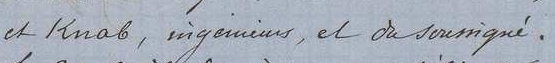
et Knab, ingenieurs, et du soussigné.
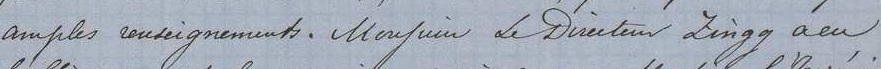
amples renseignements. Monsieur Le Directeur Zingg a eu
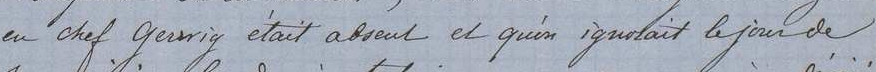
en chef Gerwig était absent et qu'on ignorait le jour de
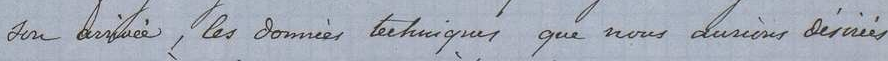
son arrivée, les données techniques que nous aurions désirées
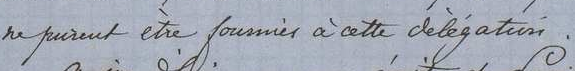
ne purent être fournies à cette délégation.
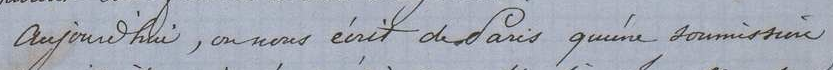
Aujourd'hui, on nous écrit de Paris qu'une soumission
